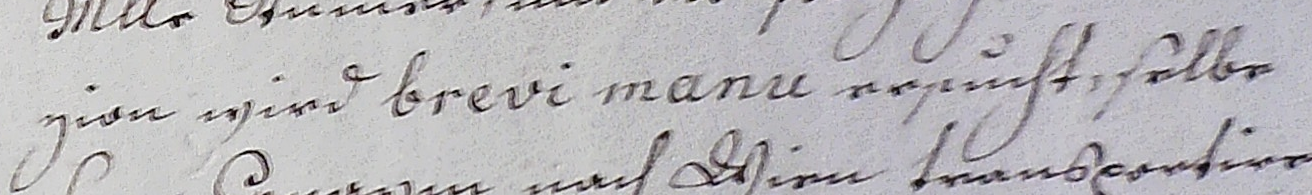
zion wird brevi manu ersucht, selbe
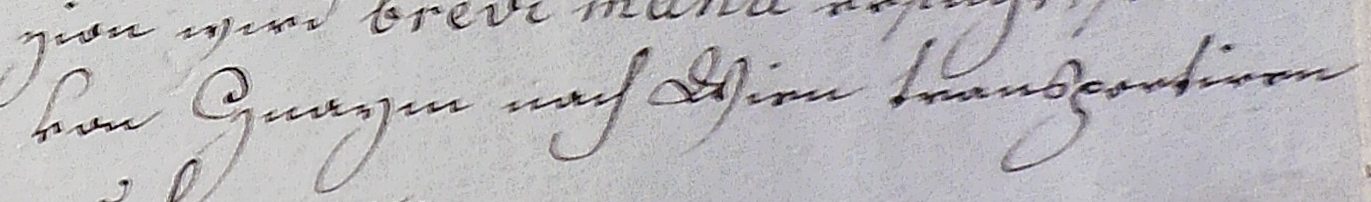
von Znaym nach Wien transportiren
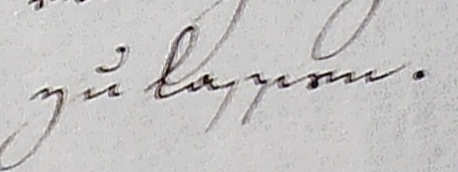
zu lassen.
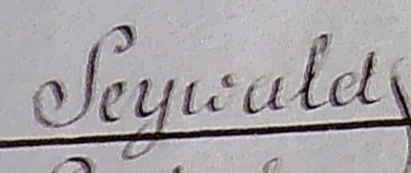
Seywald
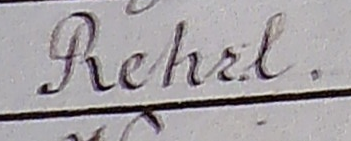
Rehrl.
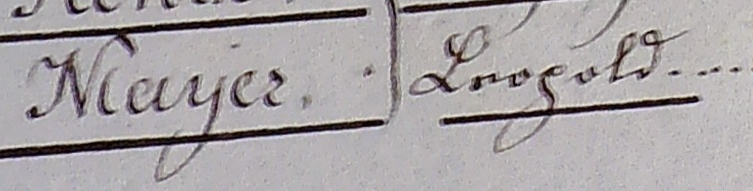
Mayer. Leopold. ..
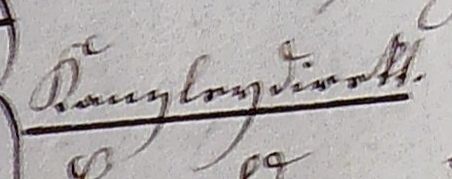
Kanzleydirekt.
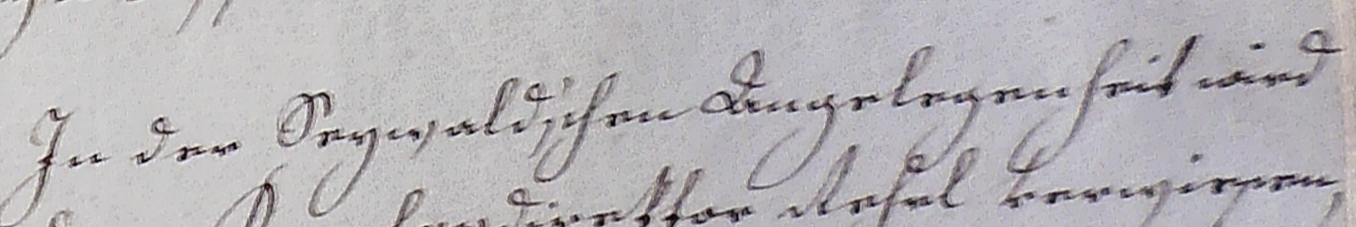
In der Seywald'schen Angelegenheit wird
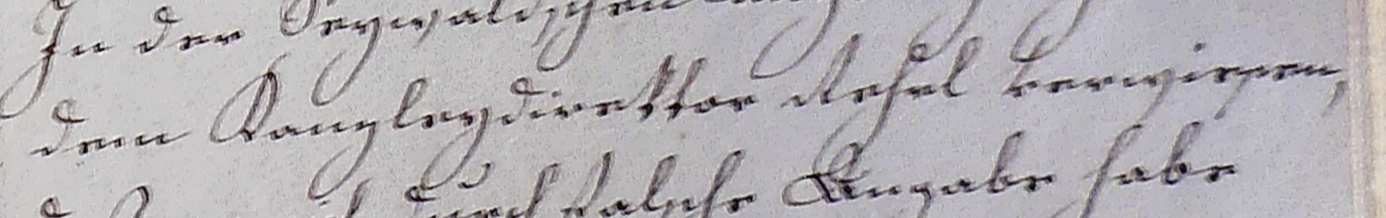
dem Kanzleydirektor Rehrl verwiesen,
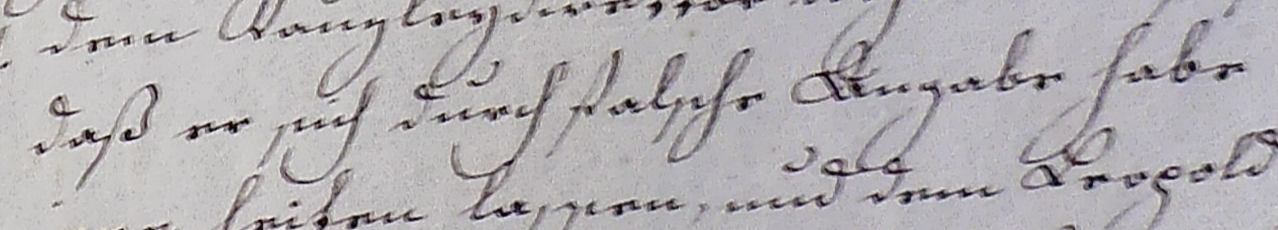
daß er sich durch falsche Angabe habe
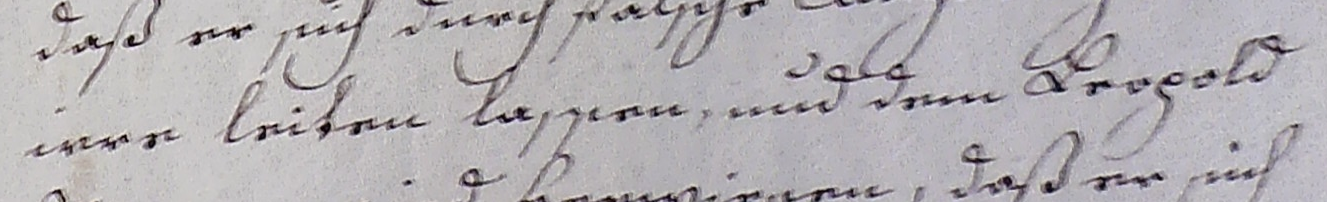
irre leiten lassen, und dem Leopold
